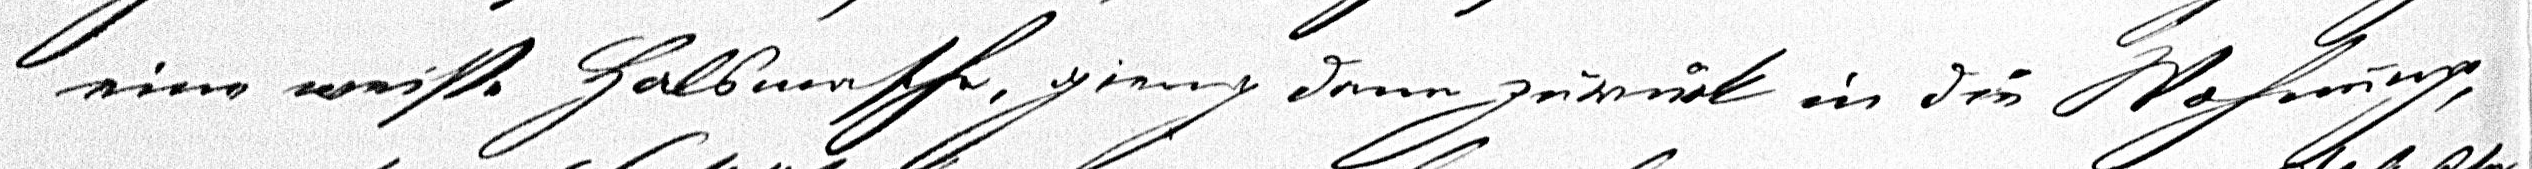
eine weiße Halsmasche, gieng dann zurück in die Wohnung,
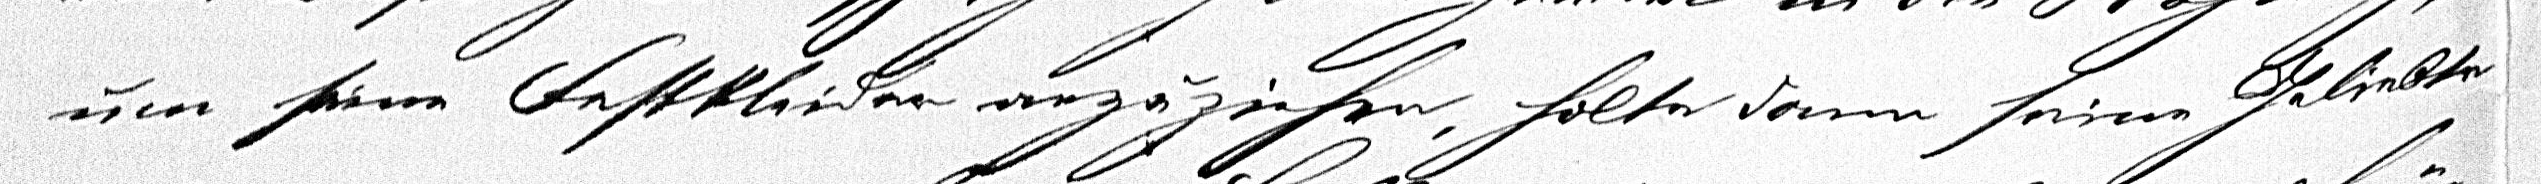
um seine Festkleider anzuziehen, holte dann seine Geliebte
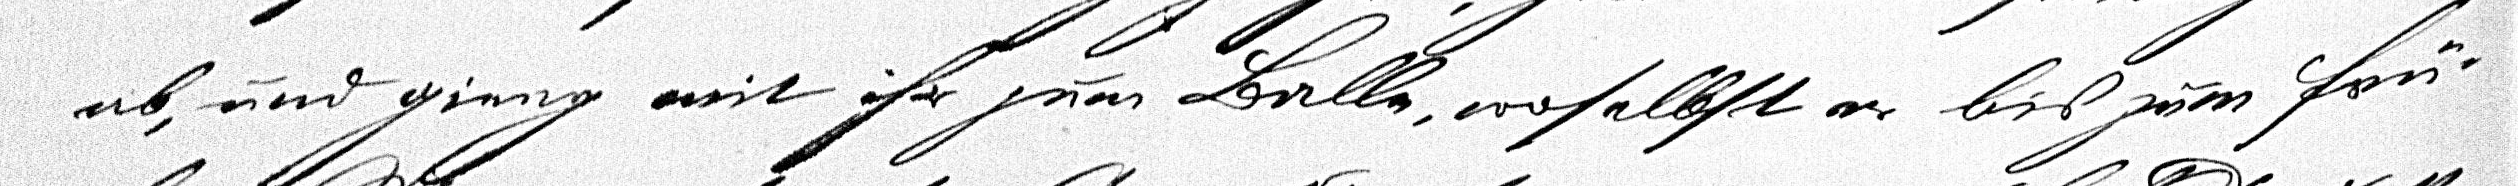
ab, und gieng mit ihr zum Balle, woselbst er bis zum Frü¬
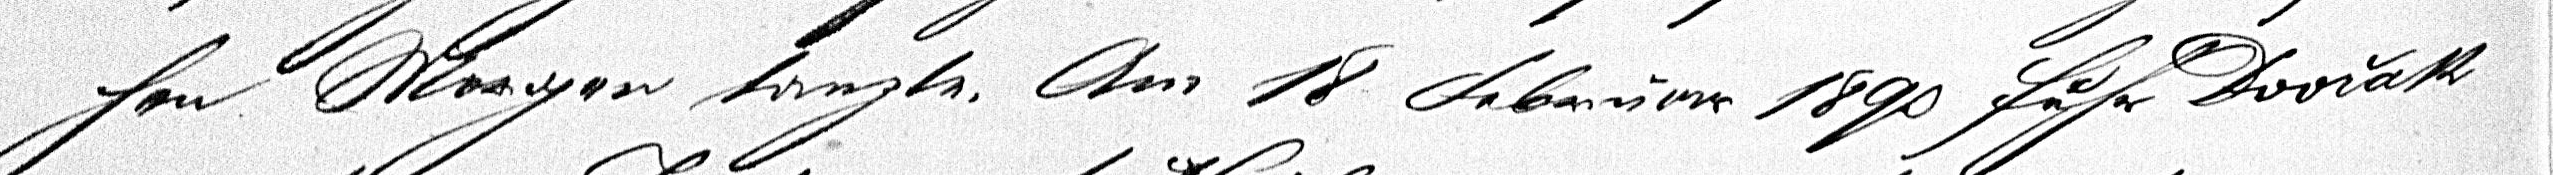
hen Morgen tanzte. Am 18 Februar 1890 Fuhr Dvořak
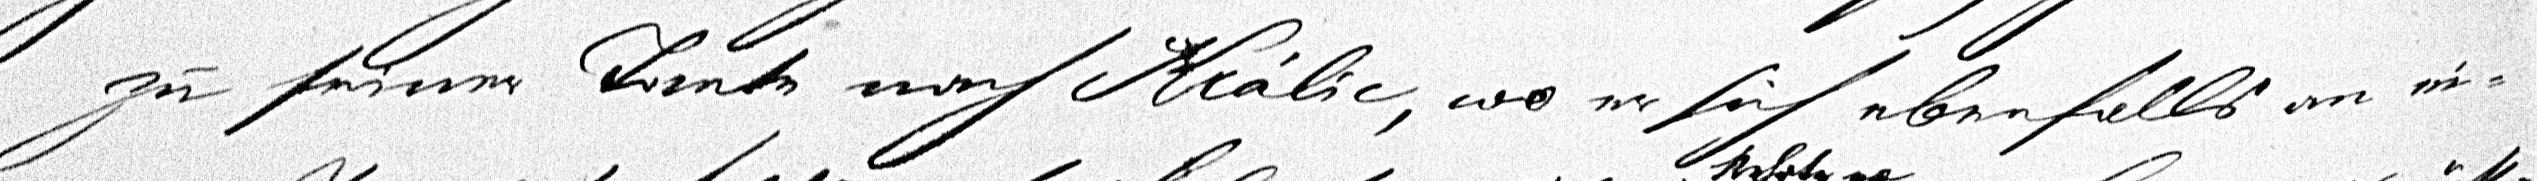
zu seiner Trete nach Králic, wo er sich ebenfalls an ei¬
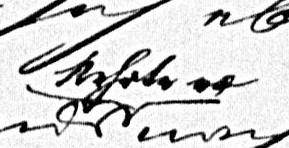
kehrte er
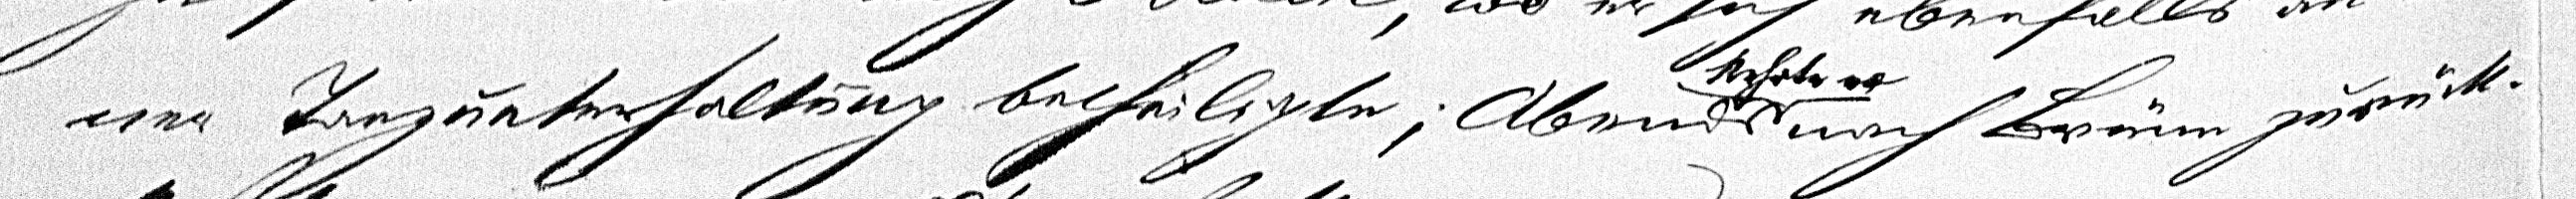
ner Tanzunterhaltung belheiligte, Abends noch Brünn zurück¬
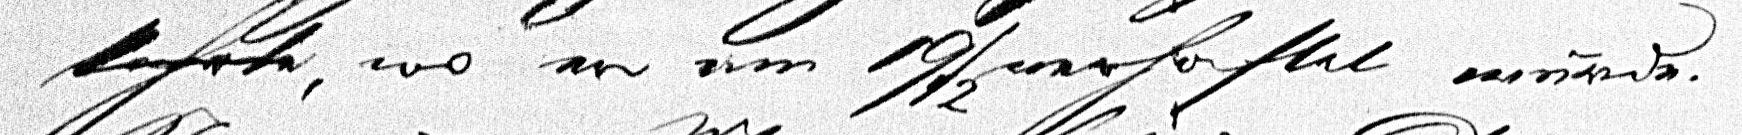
lehrte, wo er am 19/2 verhaftet wurde.
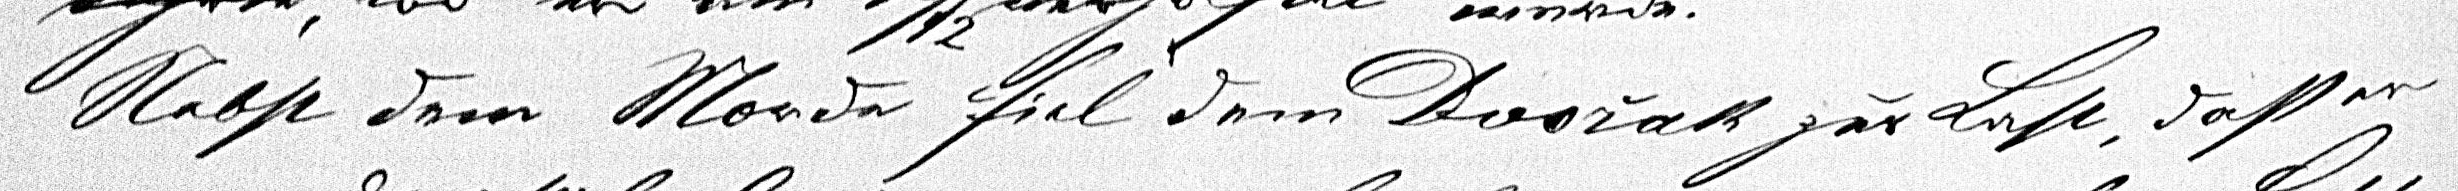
Nebst dem Morde fiel dem Dvořak zur Last, daß er
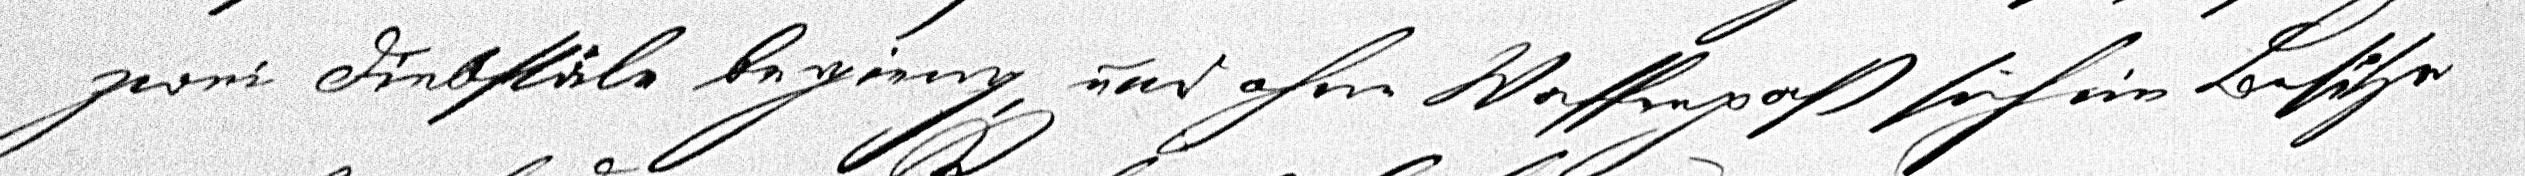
zwei Diebstäle begieng, und ohne Wasserpaß sich im Besitze
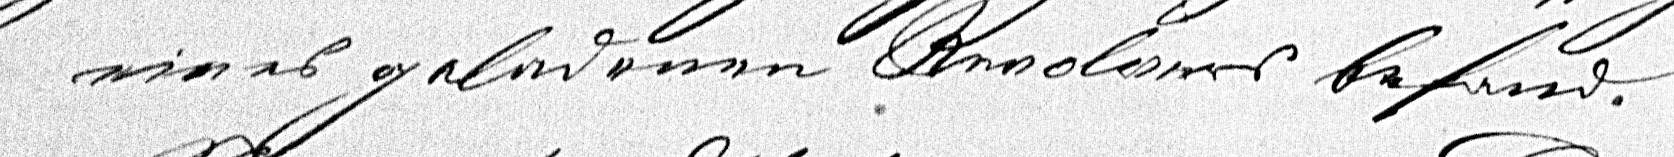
eines geladenen Revolvers befand.
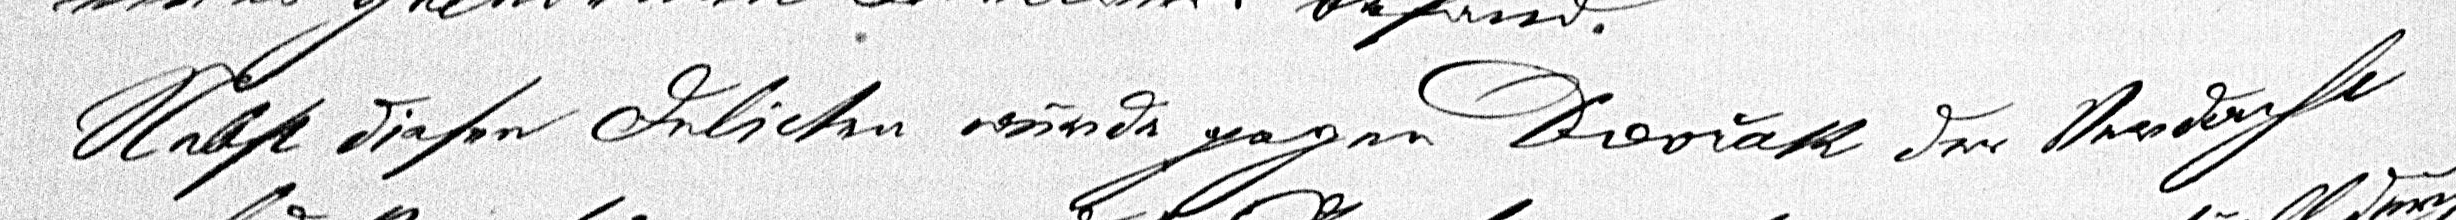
Nebst diesen Delicten wurde gegen Dvořak der Verdacht
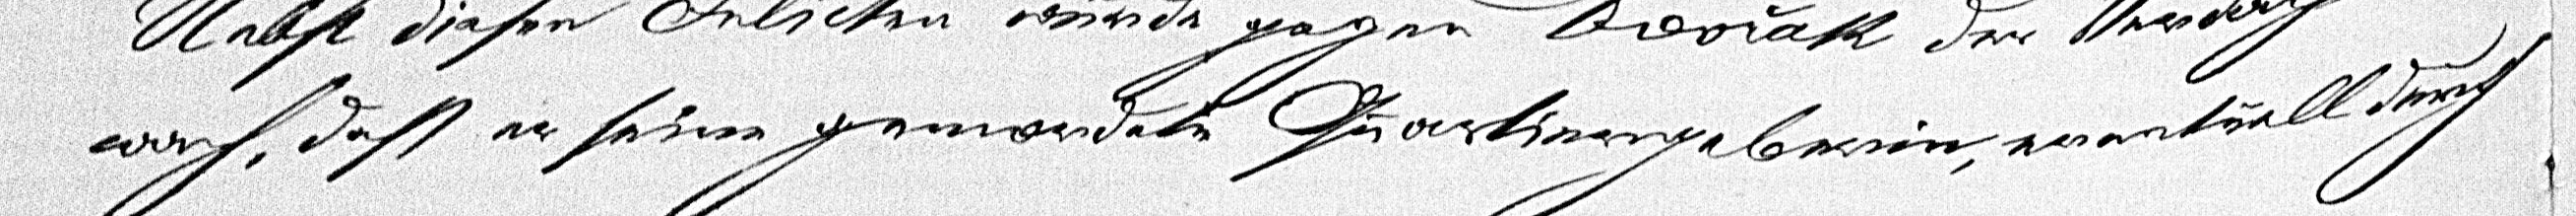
wach, daß er seine gemordete Guartiergeberin, eventuell durch
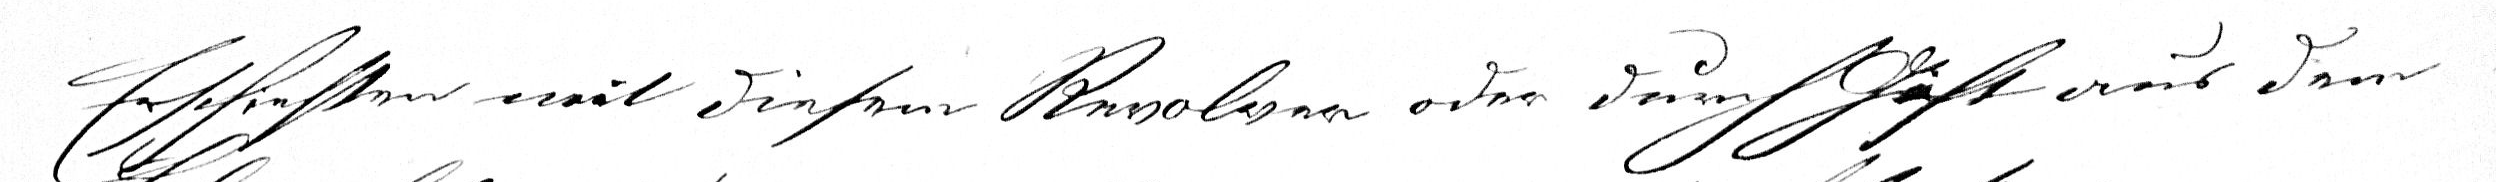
Erschiesten mit diesem Revolver oder durch Gast aus dem
